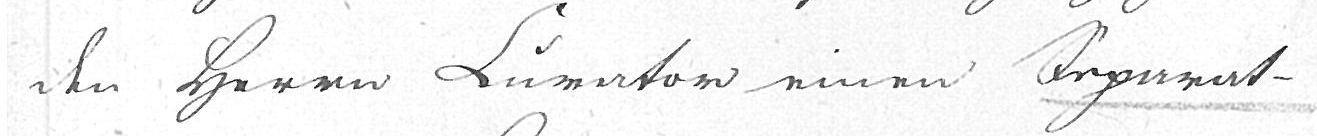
den Herrn Curator einen Separat-
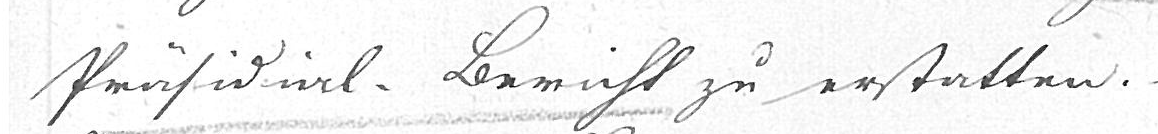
Präsidial-Bericht zu erstatten.
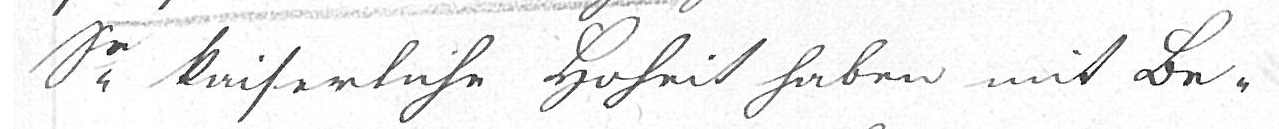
Sr. kaiserliche Hoheit haben mit Be-
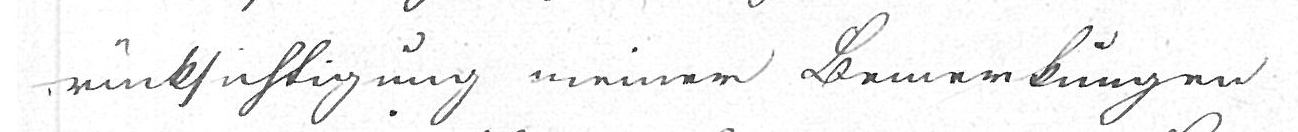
rücksichtigung meiner Bemerkungen
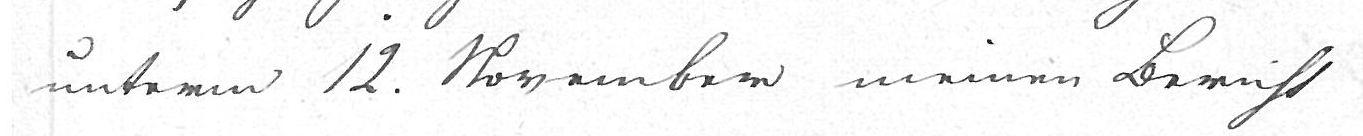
unterm 12. November meinen Bericht
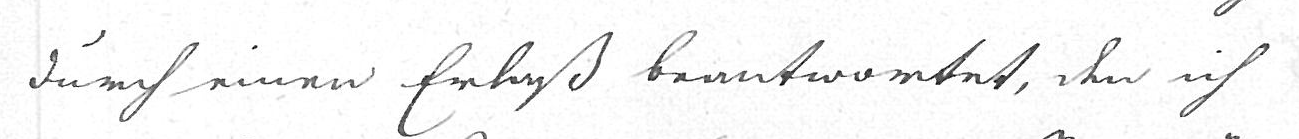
durch einen Erlaß beantwortet, den ich
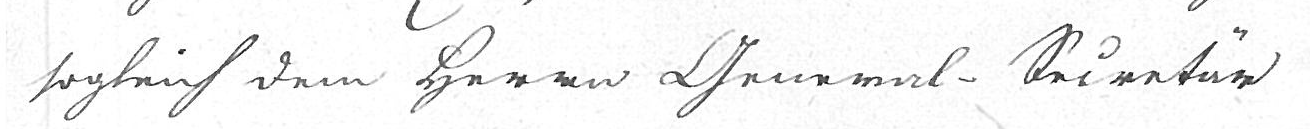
sogleich dem Herrn General-Secretär
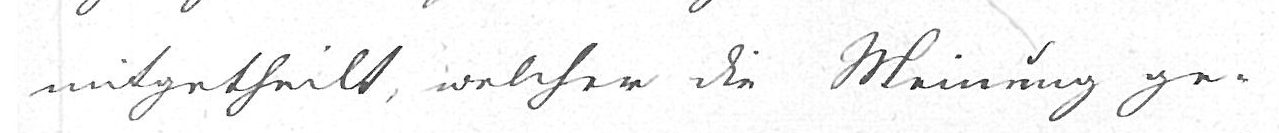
mitgeteilt, welcher die Meinung ge-
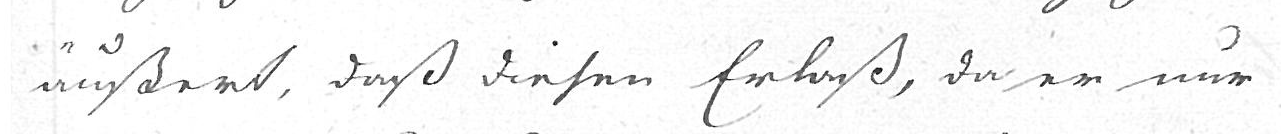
äußert, daß dieser Erlaß, da er nur
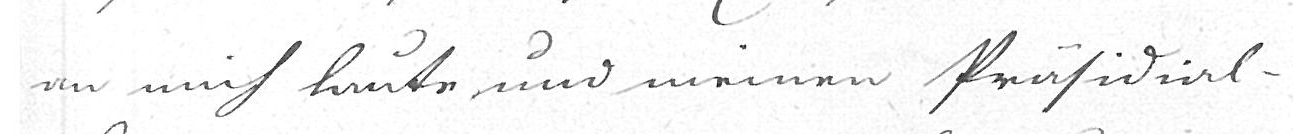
an mich laute und meinen Präsidial-
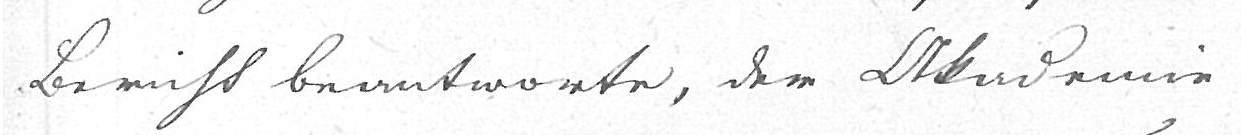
Bericht beantworte, der Akademie
